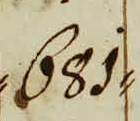681
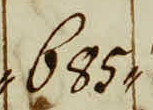685
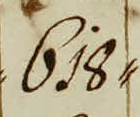618
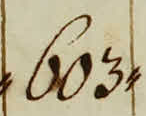603
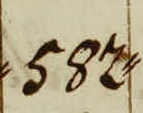582
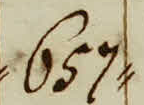657
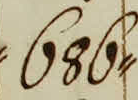686
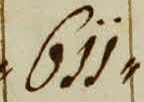611
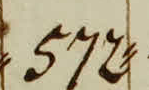572
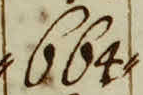664
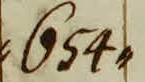654
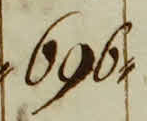696
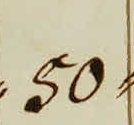50
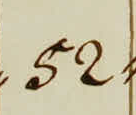52
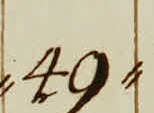49
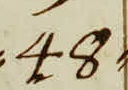48
